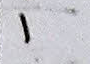1
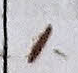1
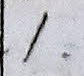1
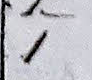1
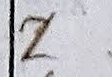2
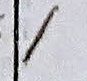1
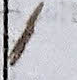1
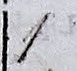1
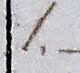1.
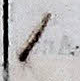1
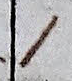1
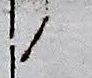1
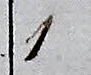1
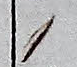1
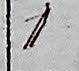1
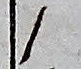1
